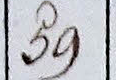59
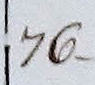76
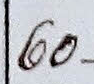60
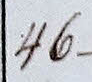46
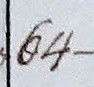64
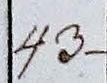43
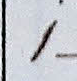1
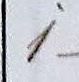1
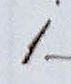1
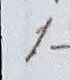1
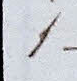1
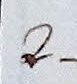2
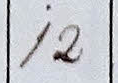12
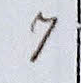7
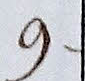9
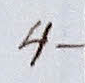4
